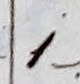1
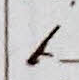1
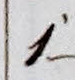1
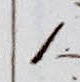1
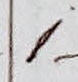1
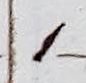1
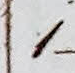1
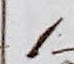1
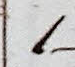1
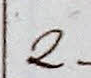2
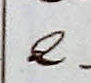2
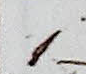1
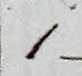1
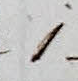1
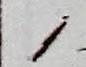1
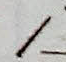1
